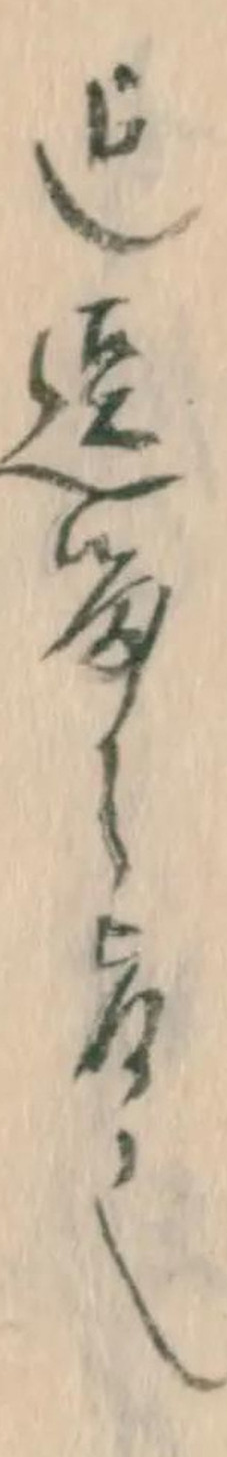迄逗留之旨也
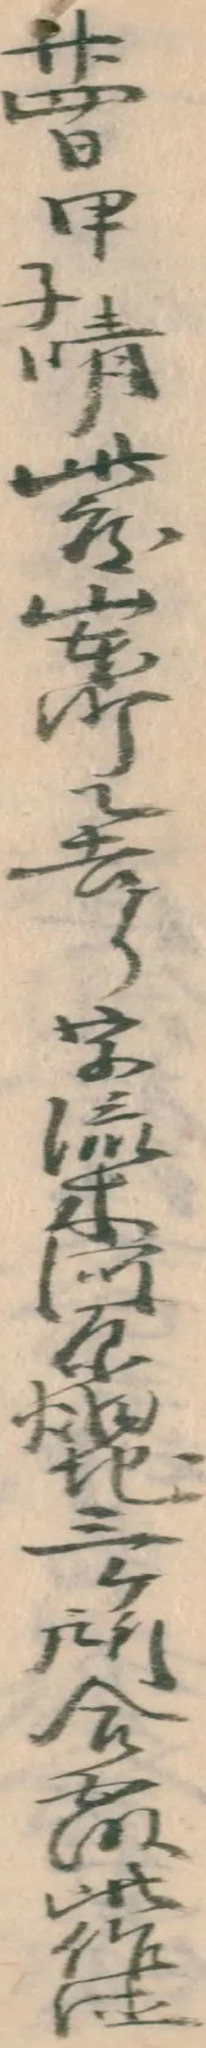廿四日甲子晴此度山本町乙吉より字流木河原畑地三ケ所合五段此作徳
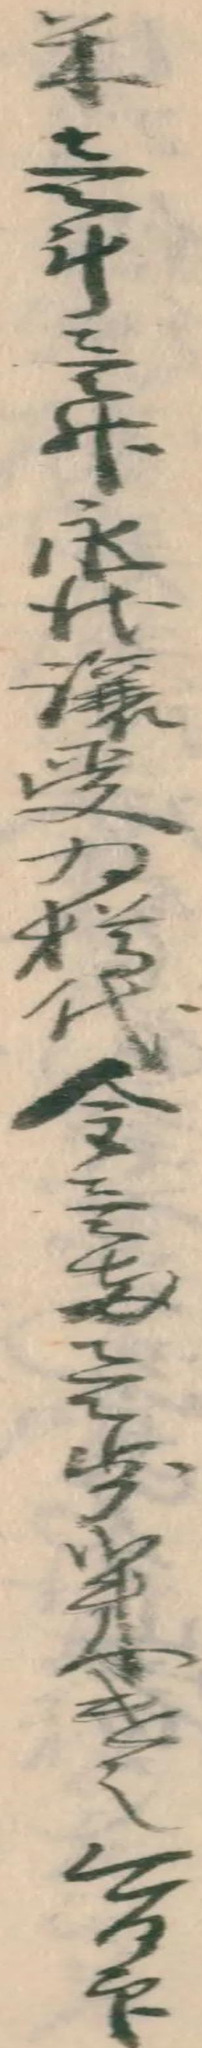米壱斗壱升永代譲受為樽代金壱両壱歩弐朱遣之今日印
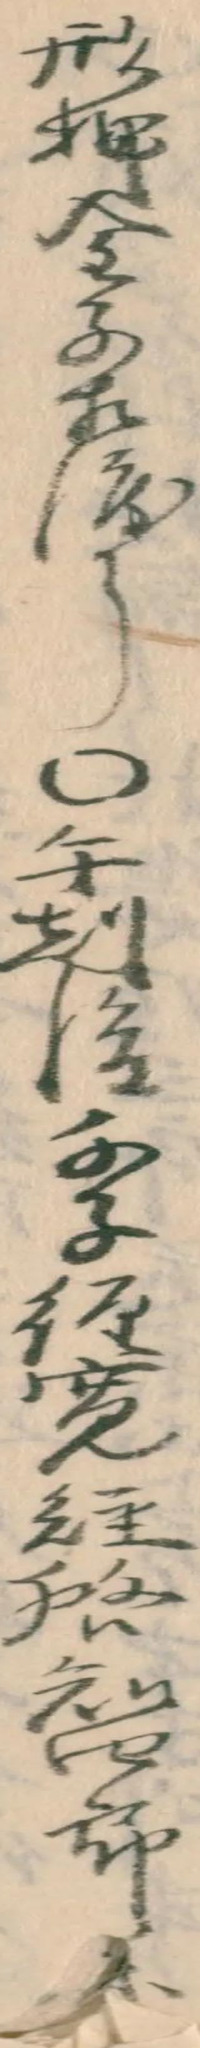形押金子相渡了○午刻後千子経寛経啓知四郎等
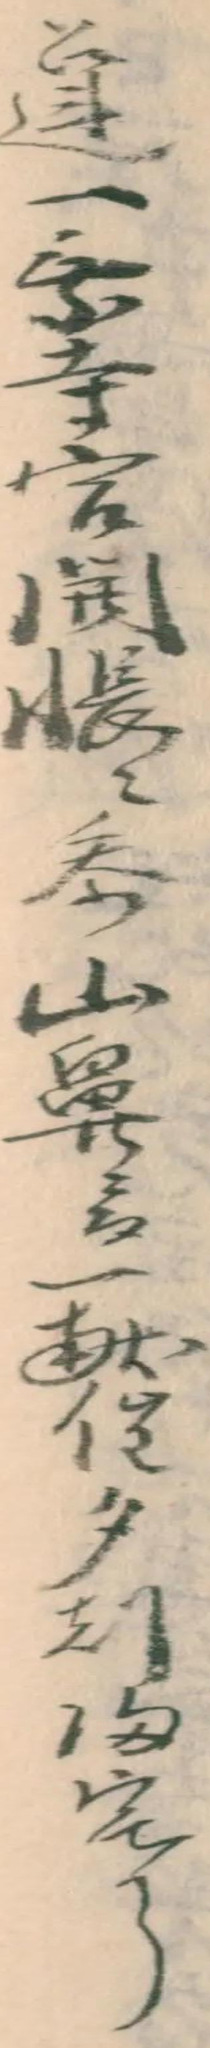召連一乗寺宮開帳ニ参山鼻ニ而一献催夕刻帰宅了
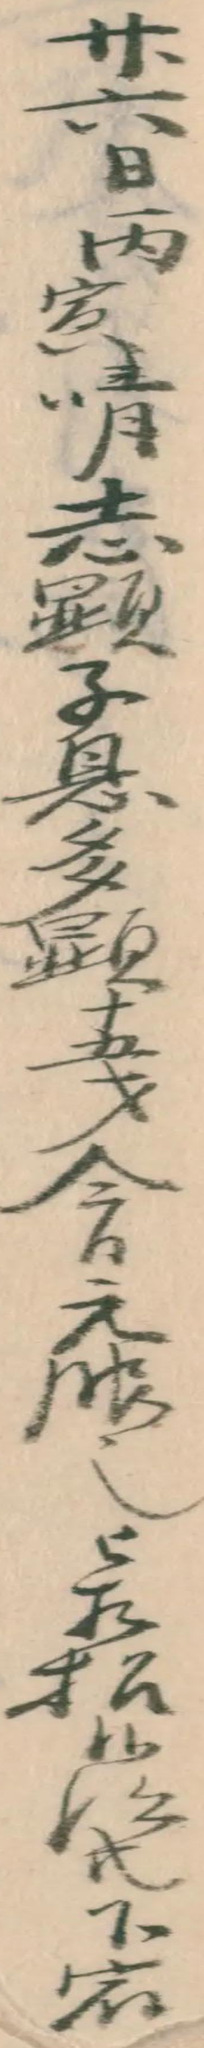廿六日丙寅晴志顕子息多顕十五才今日元服也被相招候得共下宿
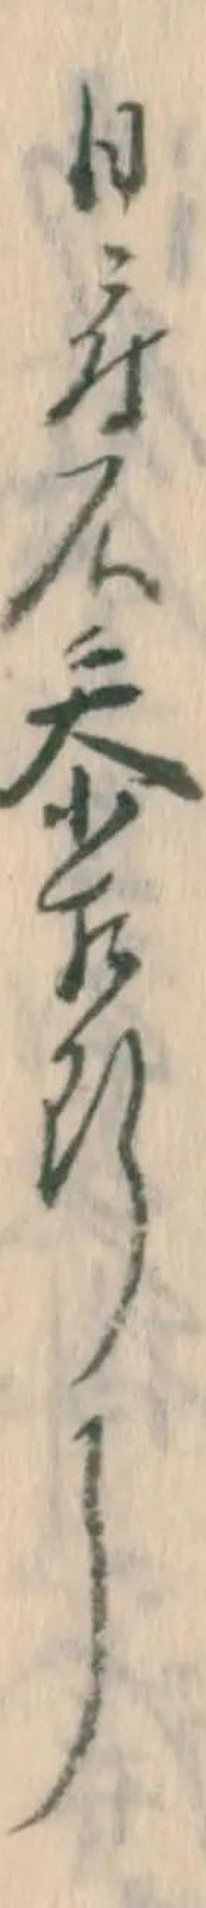日ニ付不参相断了
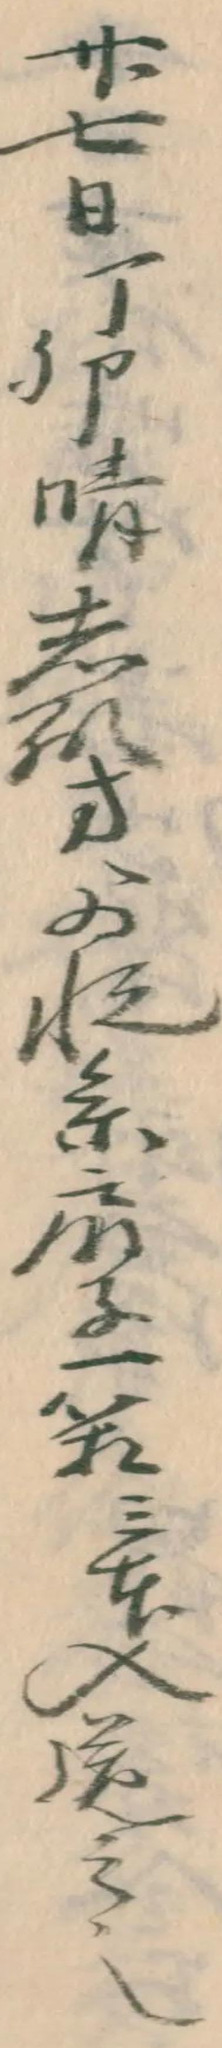廿七日丁卯晴志顕方への祝参扇子一箱三本入送之事
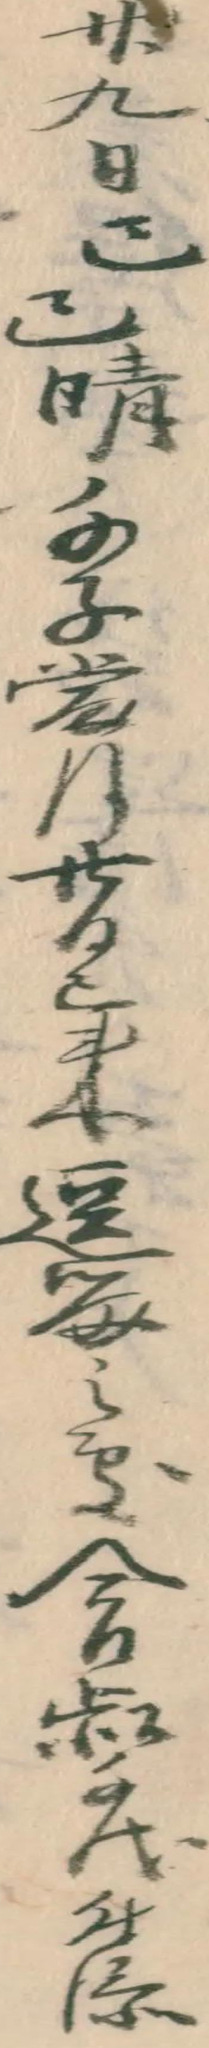廿九日己巳晴千子當月廿日已来逗留之處今日叔千代付添
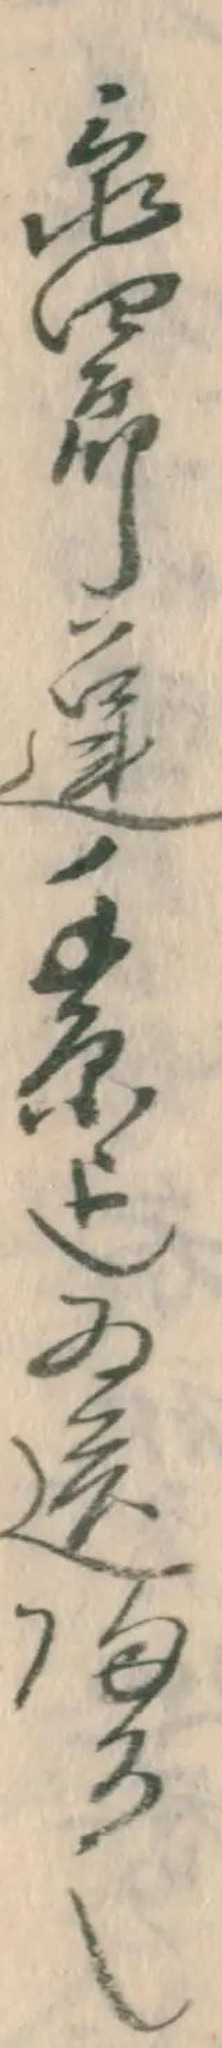亀四郎召連手原迄為送帰有也
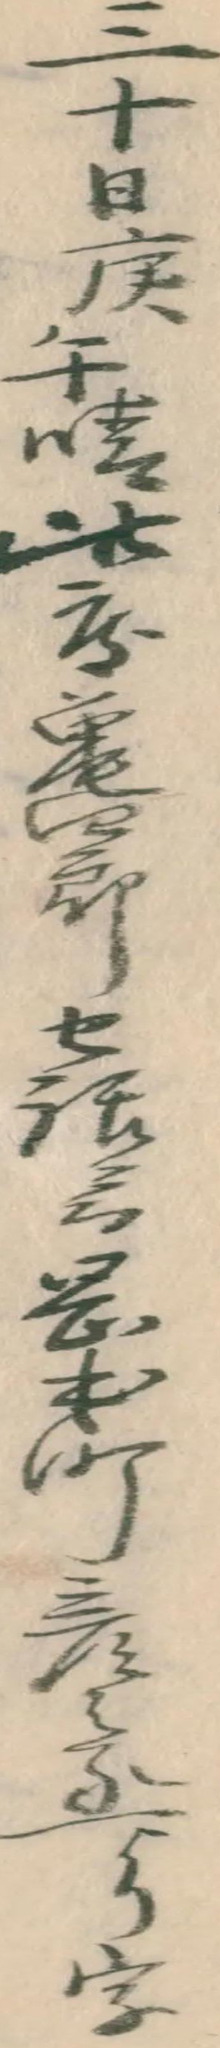三十日庚午晴此度亀四郎世話ニ而岡本町彦之丞より字
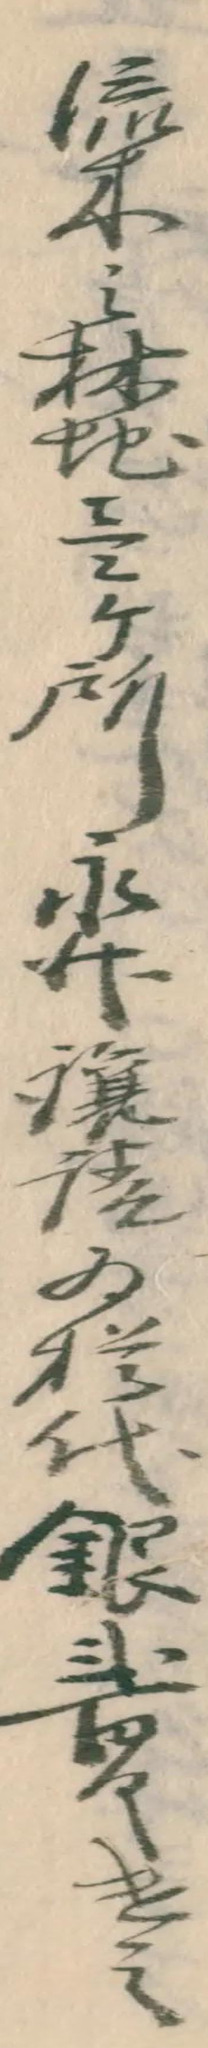流木之林地壱ケ所永代譲請為猶代銀弐百匁遣之
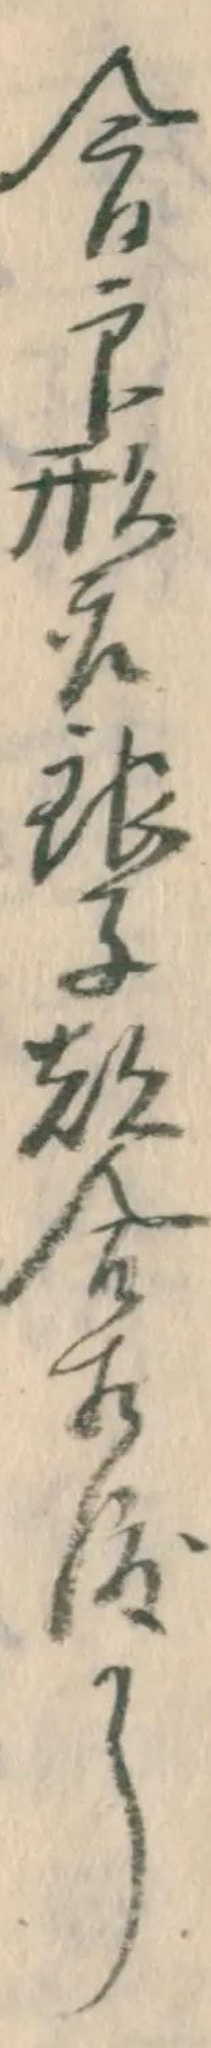今日印形取銀子都合相渡了
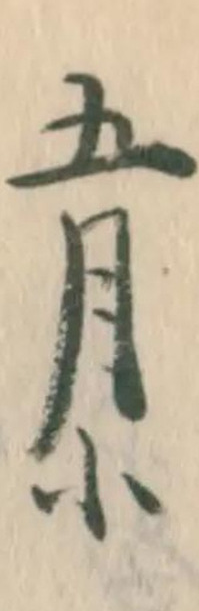五月小
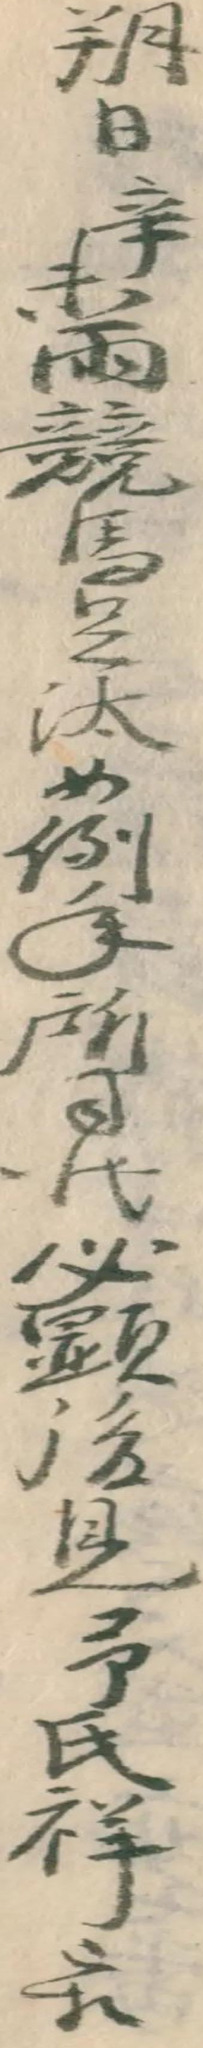三十日辛未競馬足汰如例年所司代必顕後見予氏祥被相
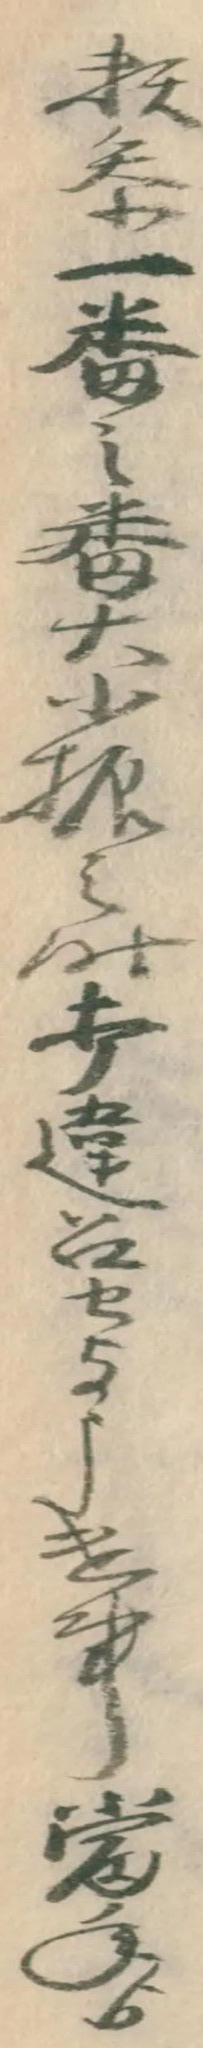参一番之番大小振之時打違召セと申遣事當年ゟ
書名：賀茂社記録. 第66冊
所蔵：国立国会図書館 National Diet Library, JAPAN
